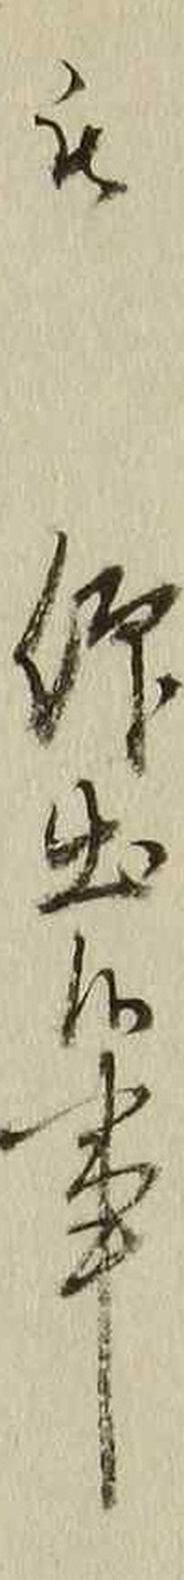被仰出候事
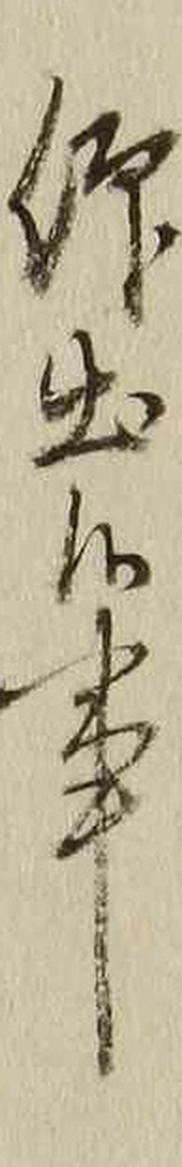仰出候事
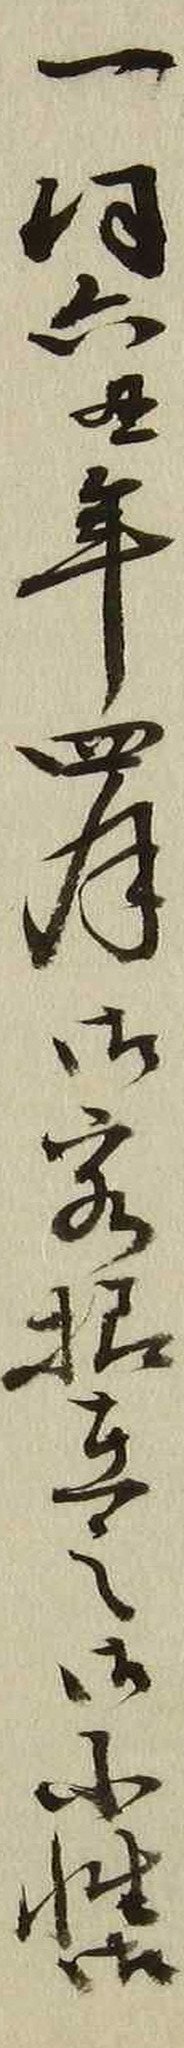一同六丑年四月御客様在之御小性御
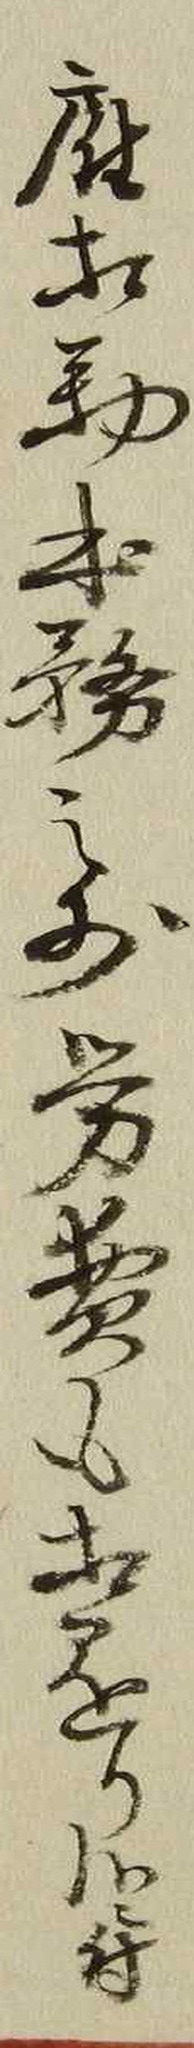雇相勤本務之外労費も相懸り候ニ付
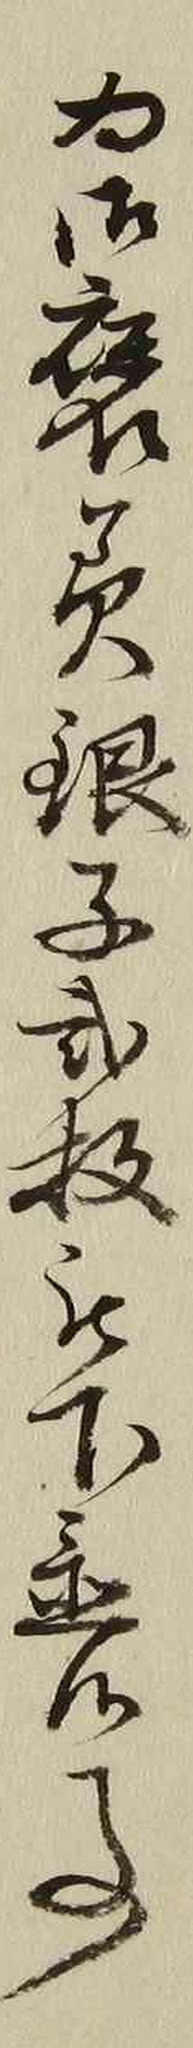為御褒美銀子弐枚被下置候事
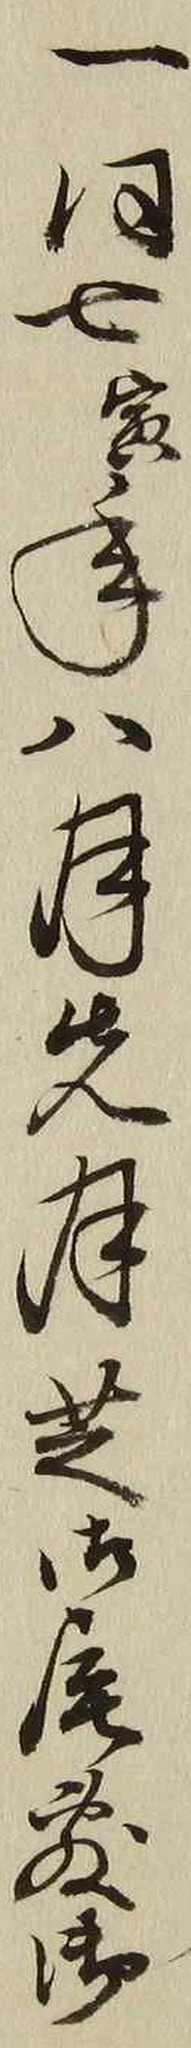一同七寅年八月先月芝御屋敷御
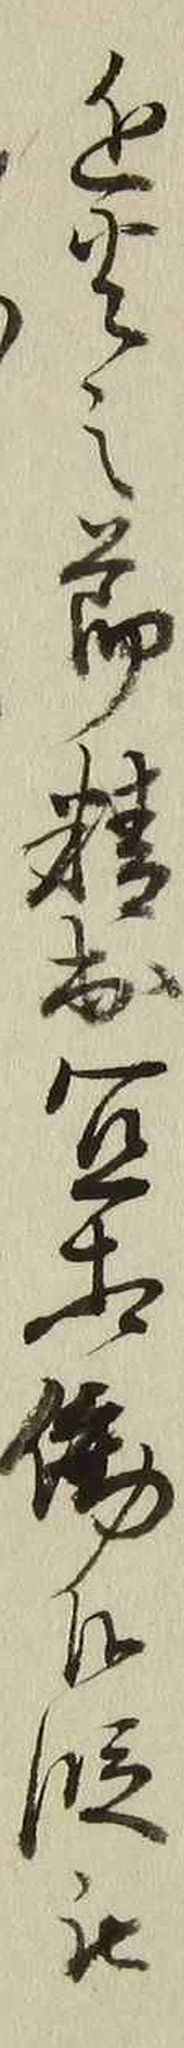近火之節精出宜相働候段被
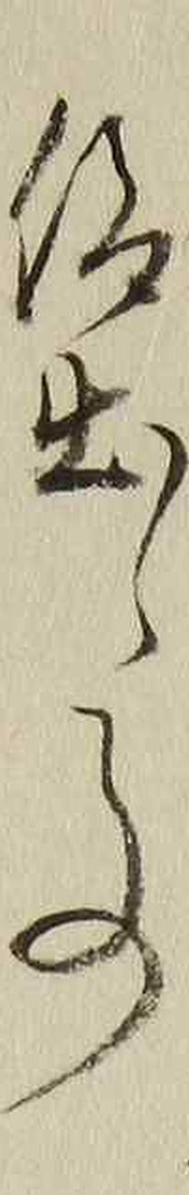仰出候事
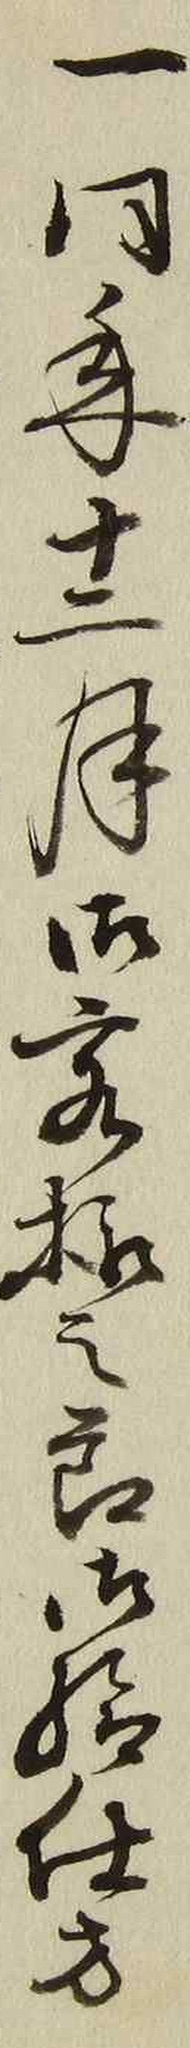一同年十二月御客様之節御給仕方
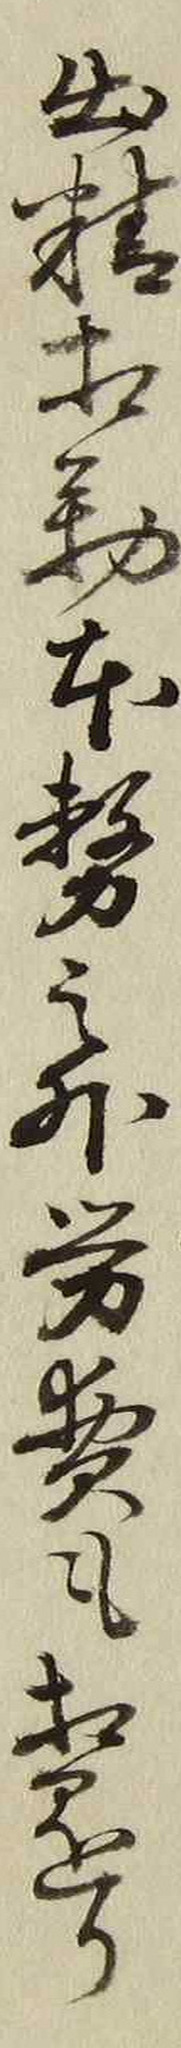出精相勤本務之外労費も相懸り
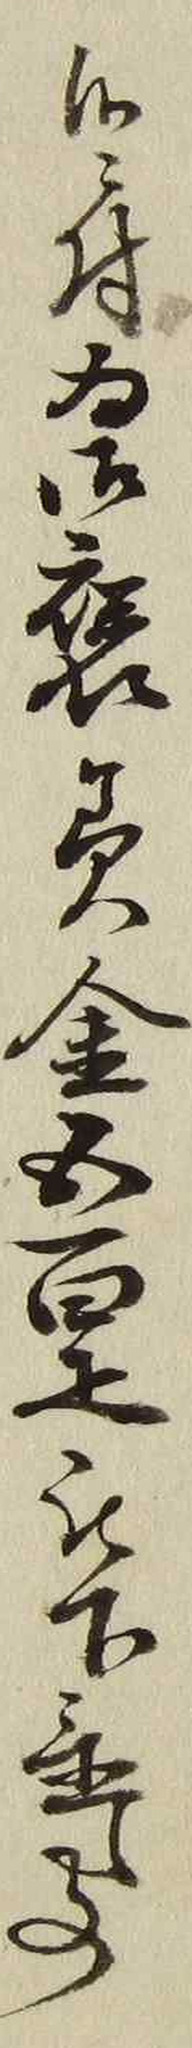候ニ付為御褒美金五百疋被下置候事
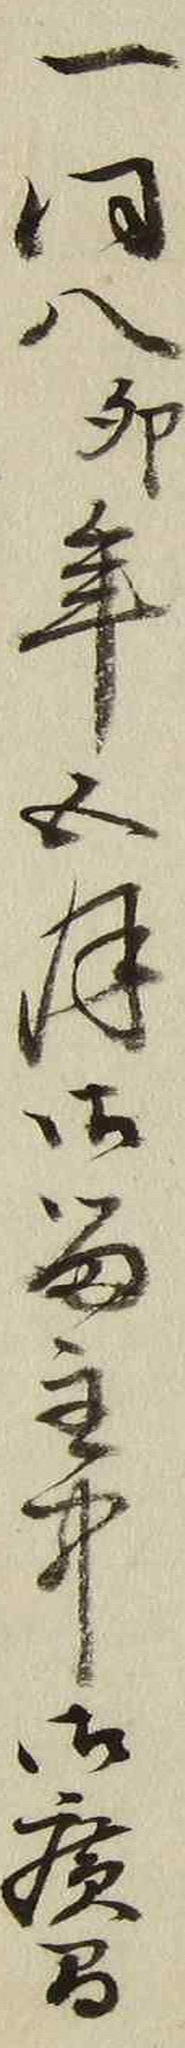一同八卯年五月御留守中御広間
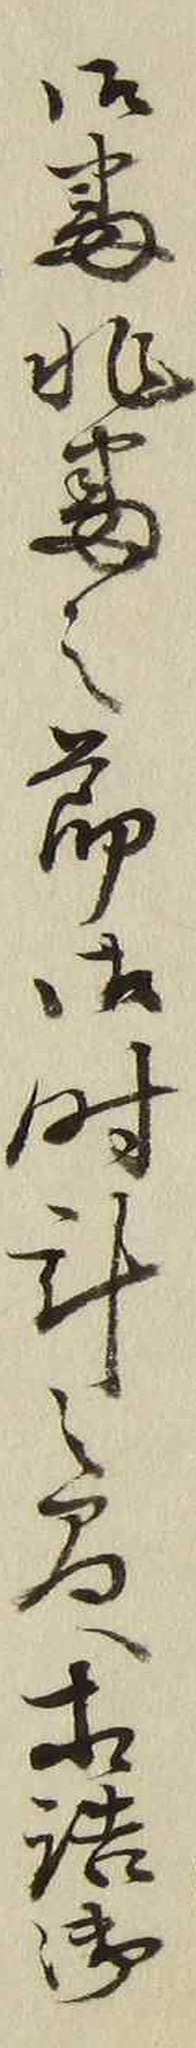御番非番之節御時計の間へ相詰御
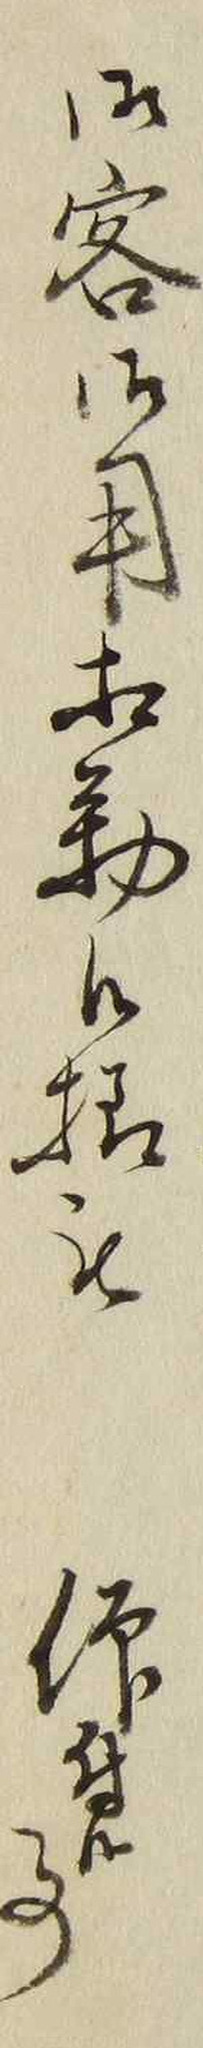御客御用相勤候様被仰付候事
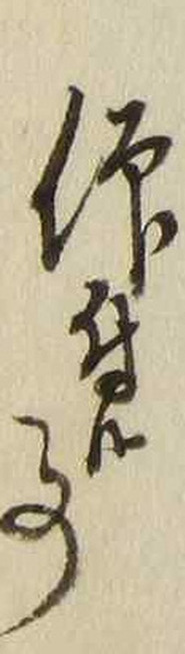仰出候事

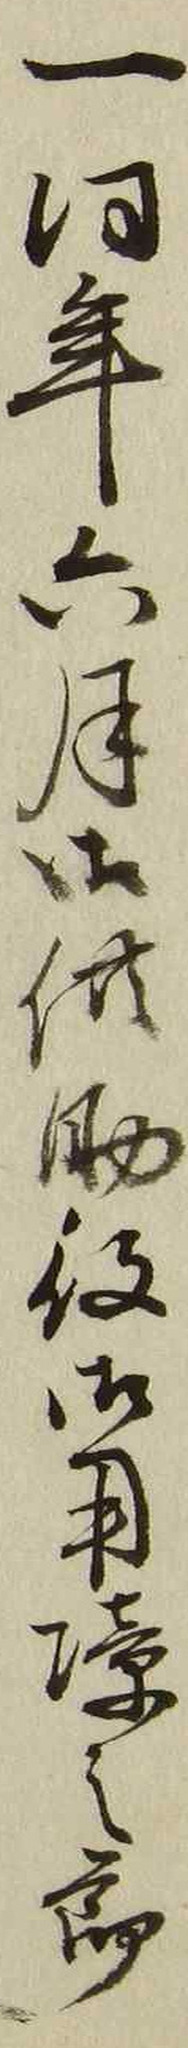一同年六月御供助役御用障之節
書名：諸士系譜　巻之35　は之部3
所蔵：会津若松市立会津図書館
